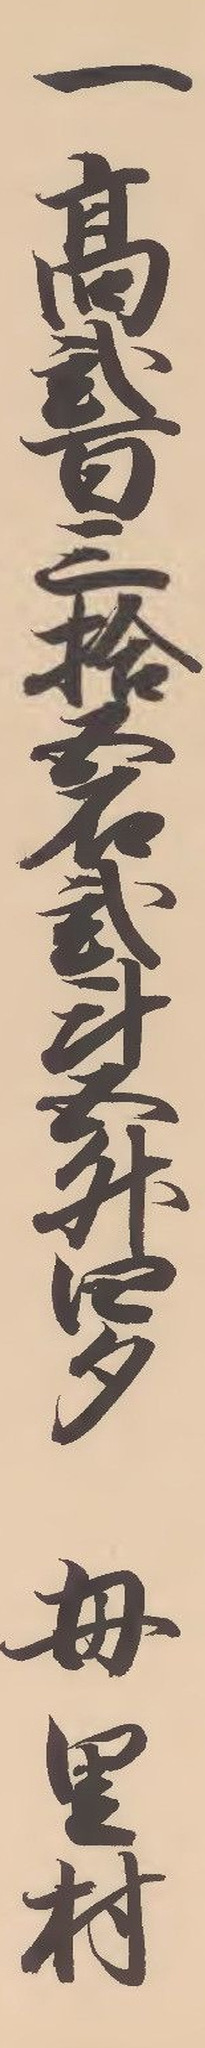一高弐百三拾五石弐斗五升四勺母里村
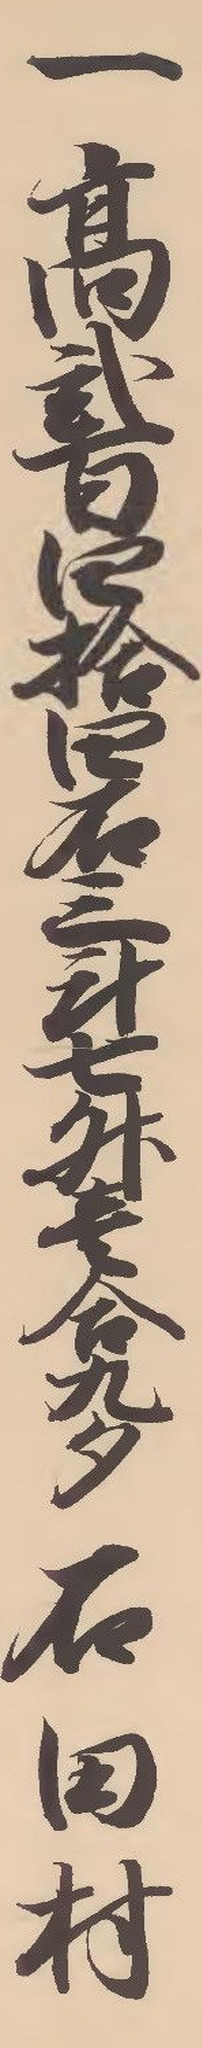一高弐百四拾四石三斗七升壱合九勺石田村
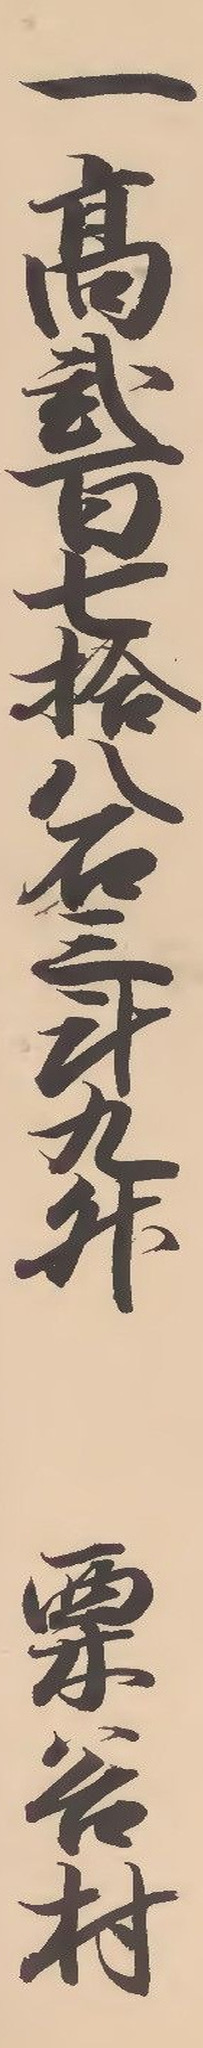一高弐百七拾八石三斗九升栗谷村
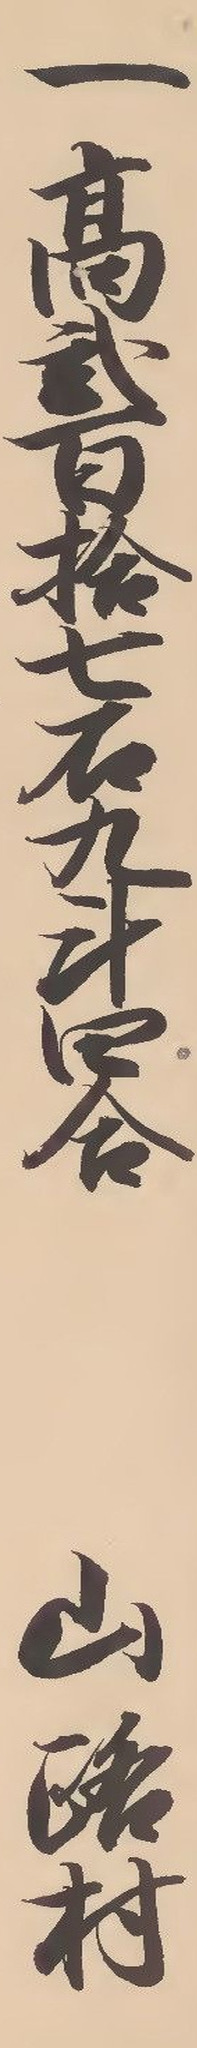一高弐百拾七石九斗四合山路村
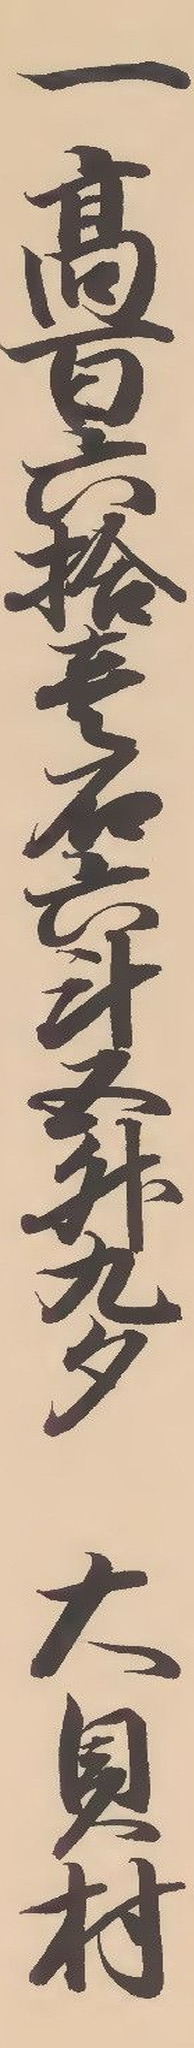一高百六拾壱石六斗五升九勺大貝村
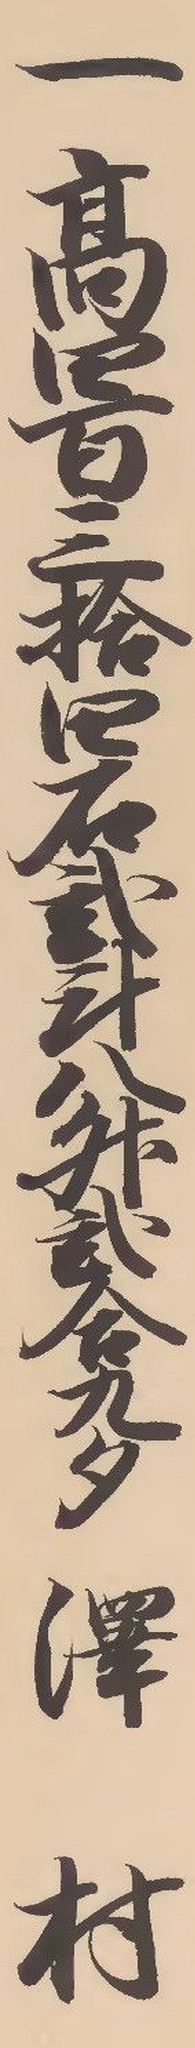一高四百三拾四石弐斗八升弐合九勺沢村
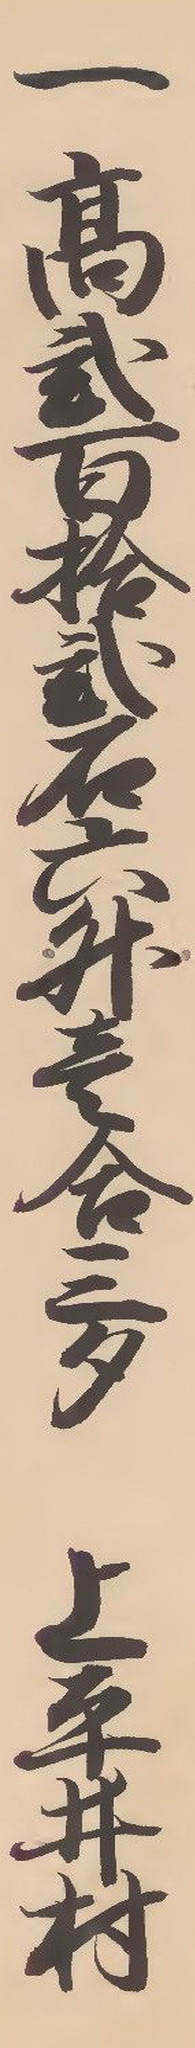一高弐百拾弐石六升壱合三勺上平井村

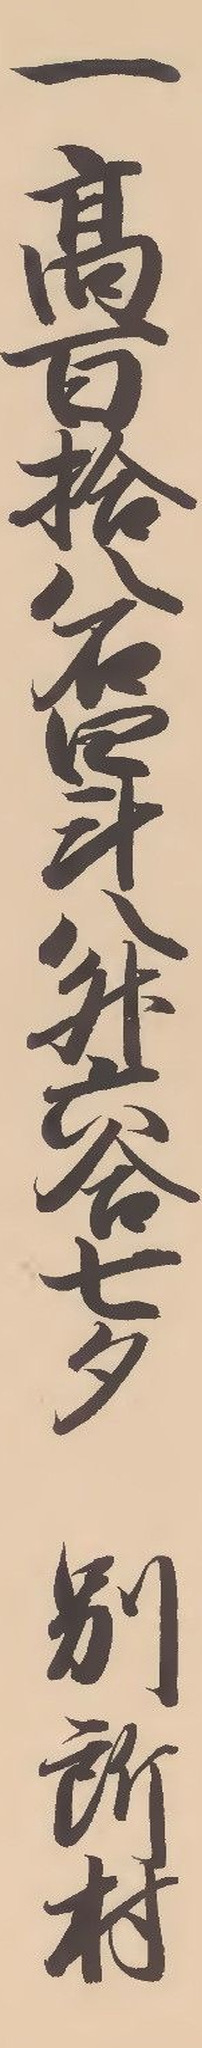一高百拾八石四斗八升六合七勺別所村
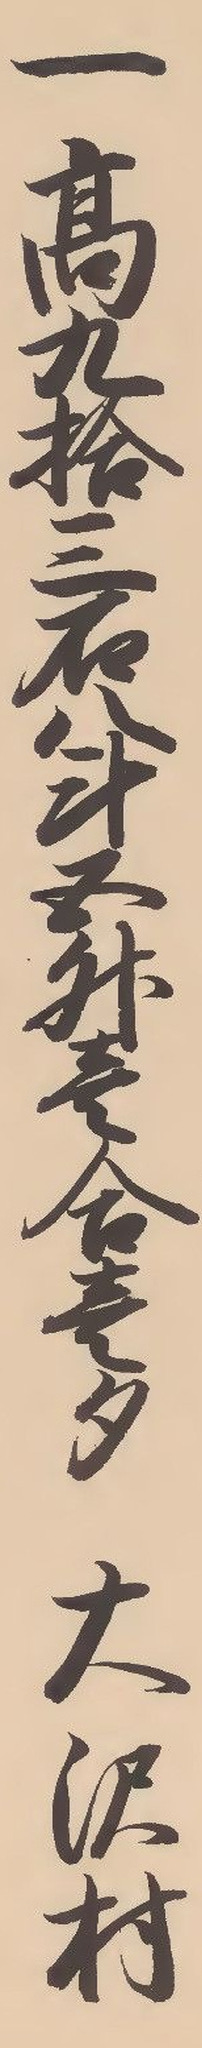一高九拾三石八斗五升壱合壱勺大沢村
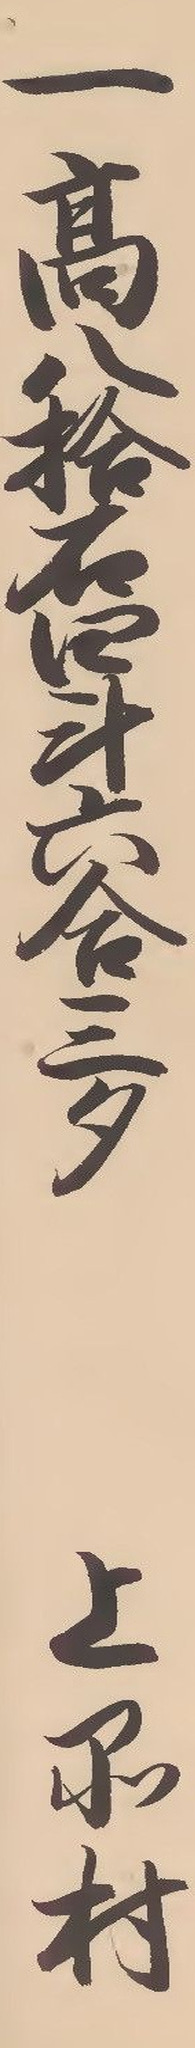一高八拾石四斗六合三勺上品村
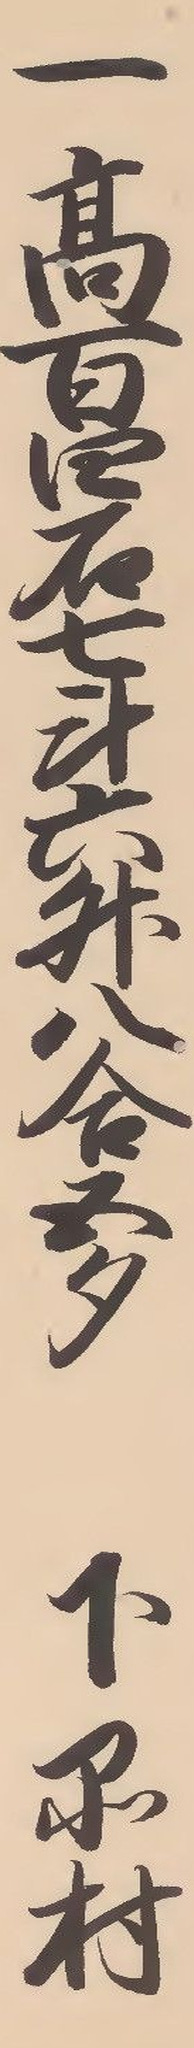一高百四石七斗六升八合五勺下品村
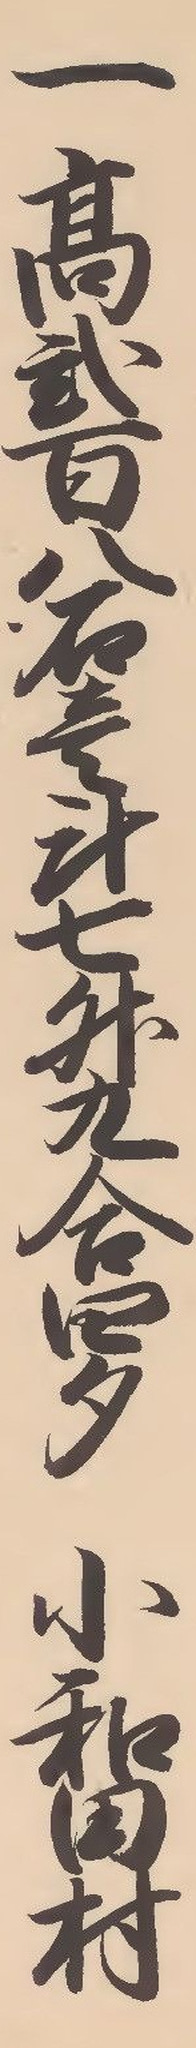一高弐百八石壱斗七升九合四勺小和田村
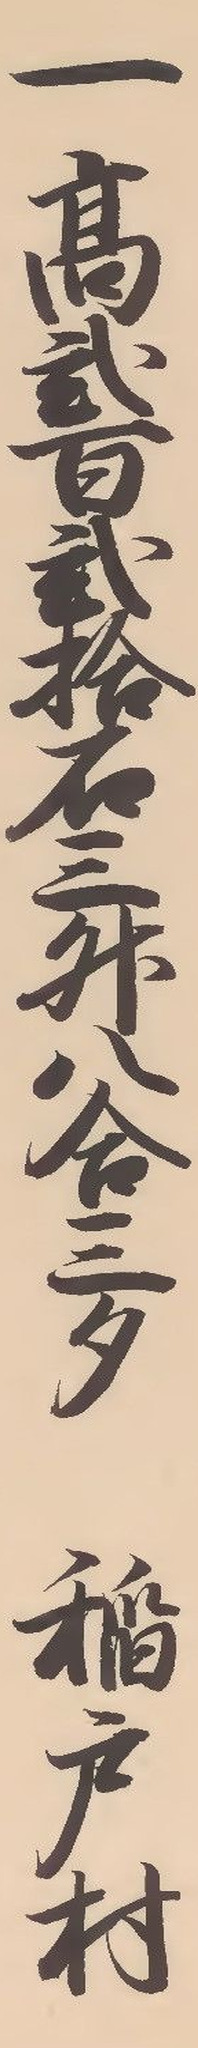一高弐百弐拾石三升八合三勺稲戸村
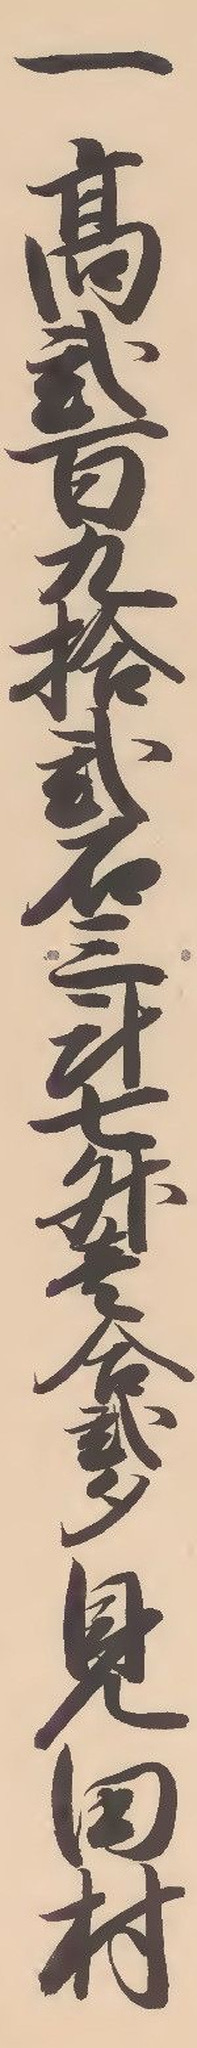一高弐百九拾弐石三斗七升壱合弐勺見田村

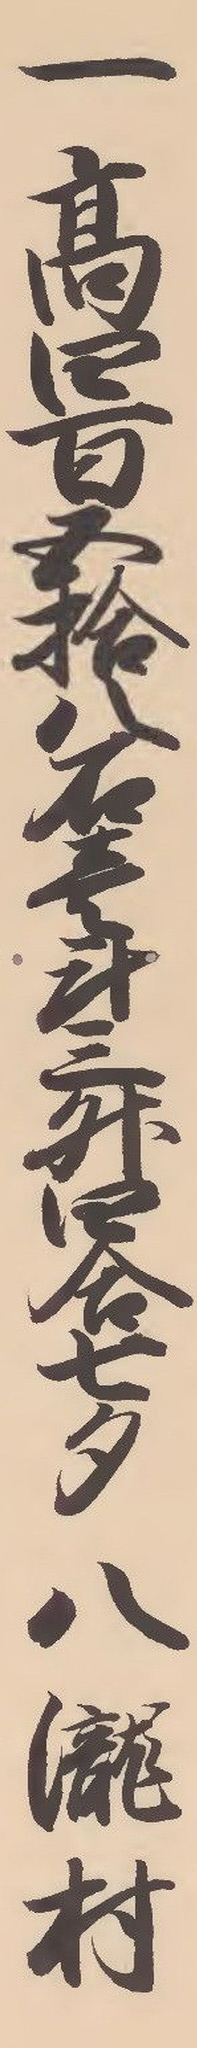一高四百五拾八石壱斗三升四合七勺八滝村
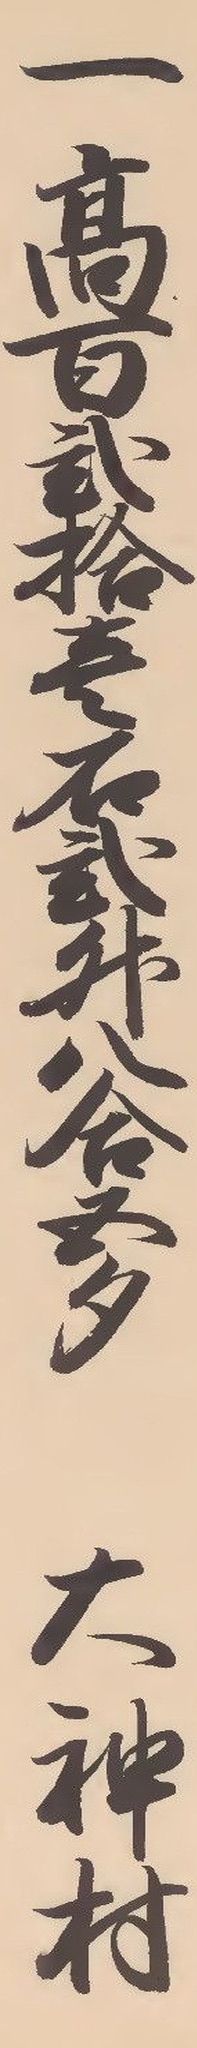一高百弐拾壱石弐升八合五勺大神村
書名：大和国郷帳
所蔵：国立公文書館 National Archives of Japan
